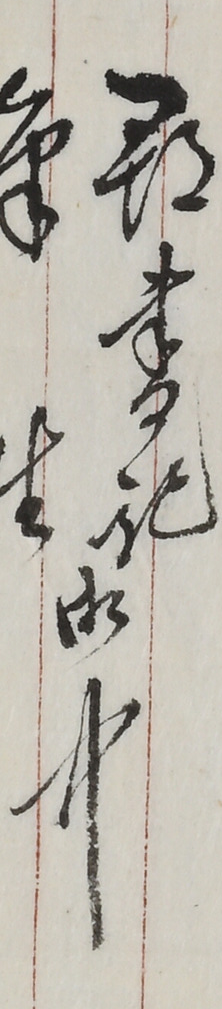郡書記御中

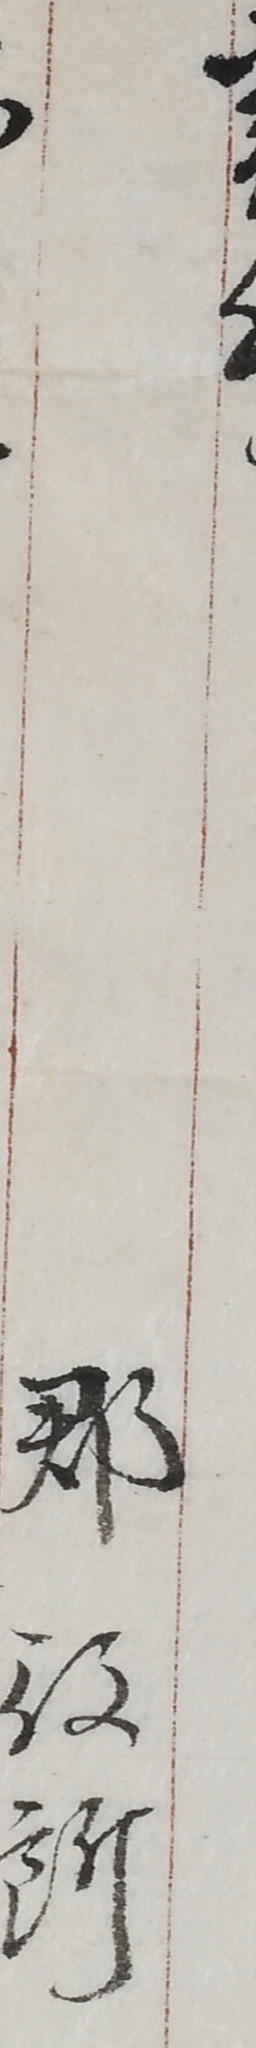郡役所
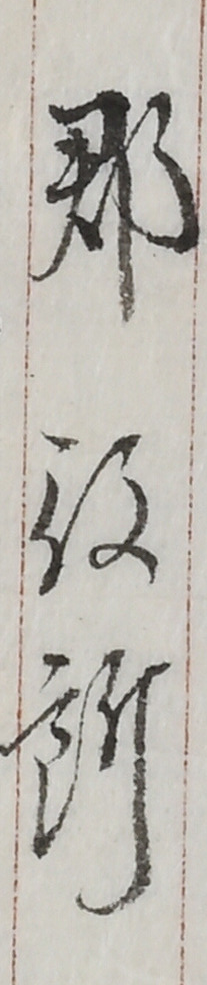郡役所
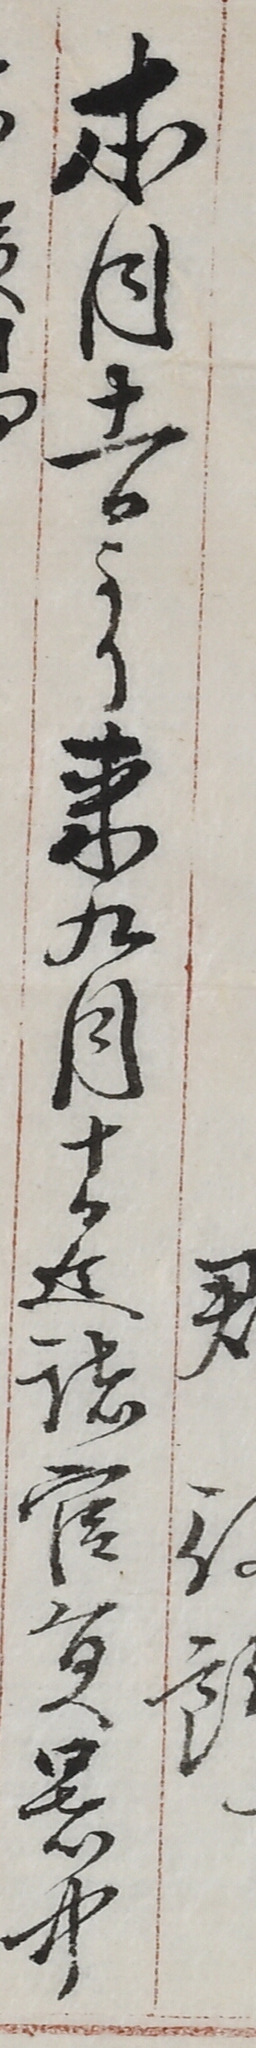本月十一日より来九月十日迄諸官員暑中
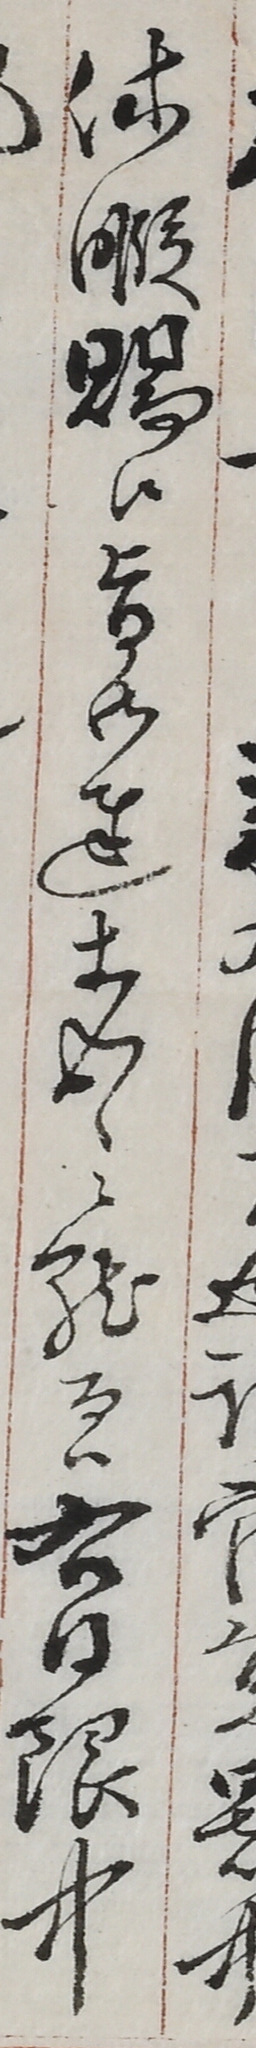休暇賜候旨御達相成候ニ就而ハ右日限中
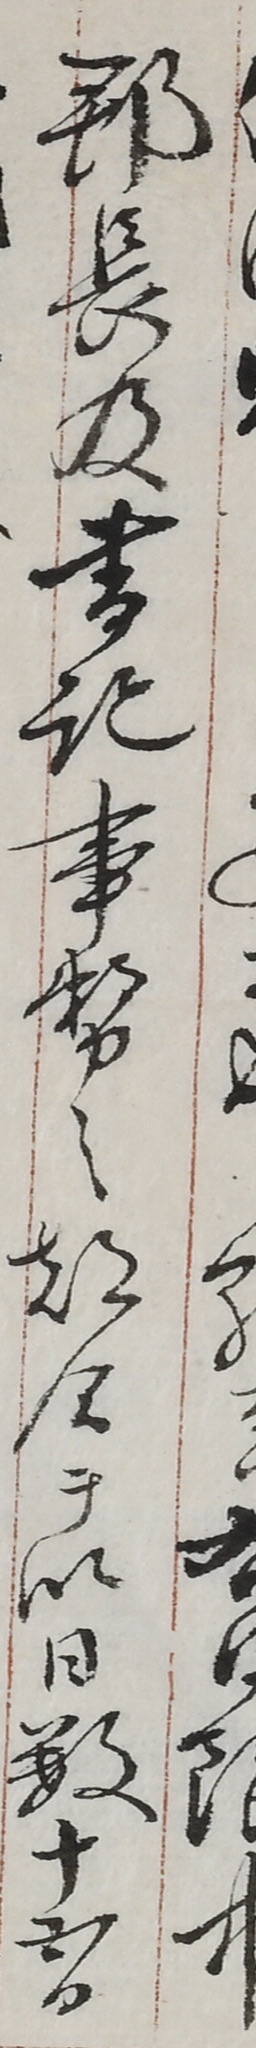郡長及書記事務之都合ヲ以日数十五日
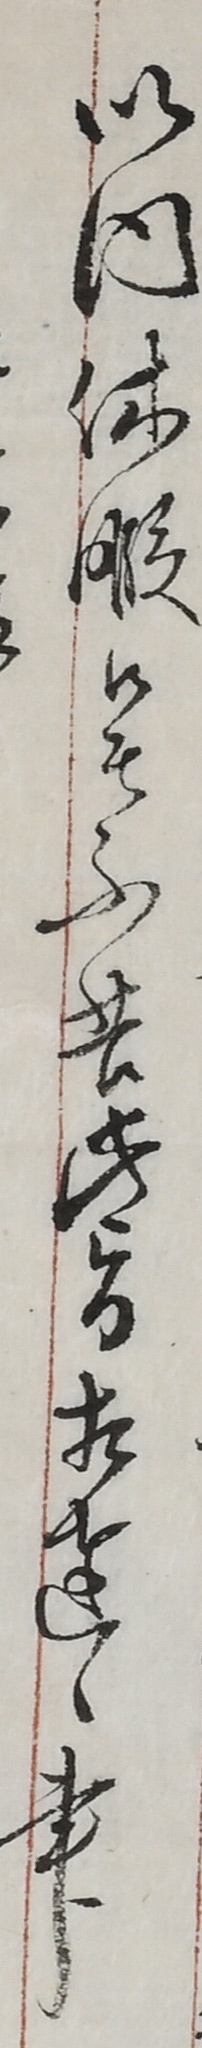以内休暇候も不苦此旨相達候事
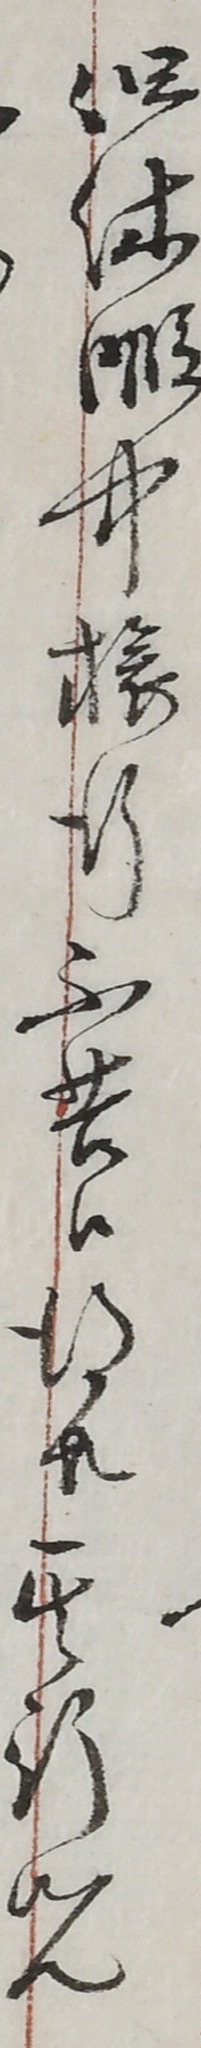但休暇中旅行不苦候得共其行先
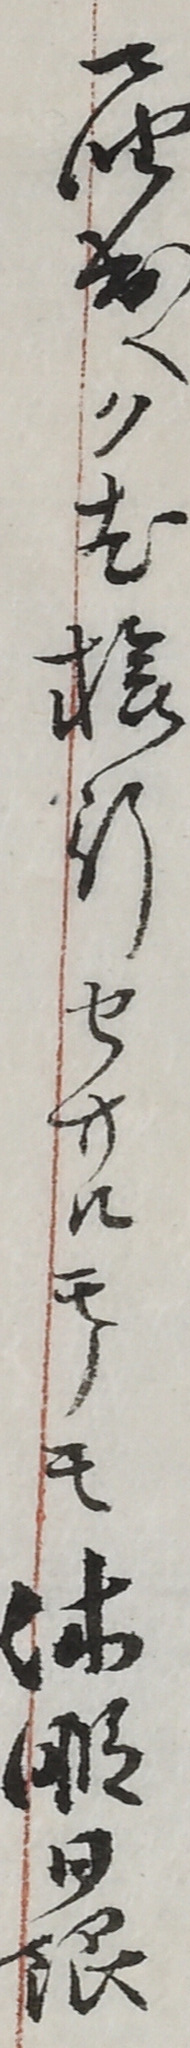届出候ヘク尤旅行セサルモノモ休暇日限
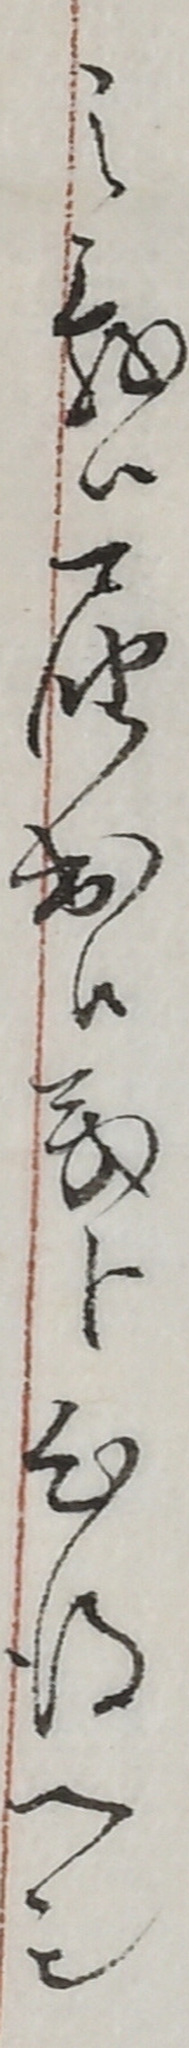之義ハ届出候義ト心得へシ
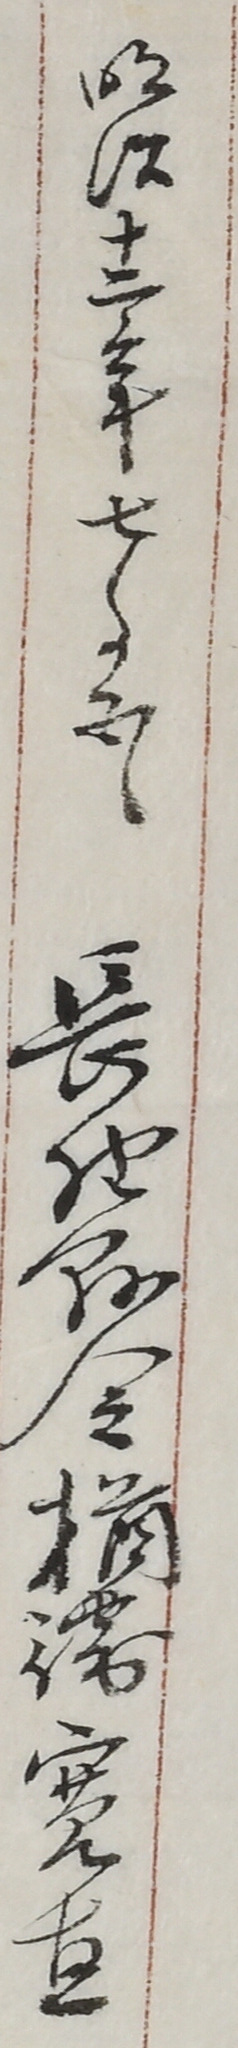明治十二年七月五日長野県令楢崎寛直

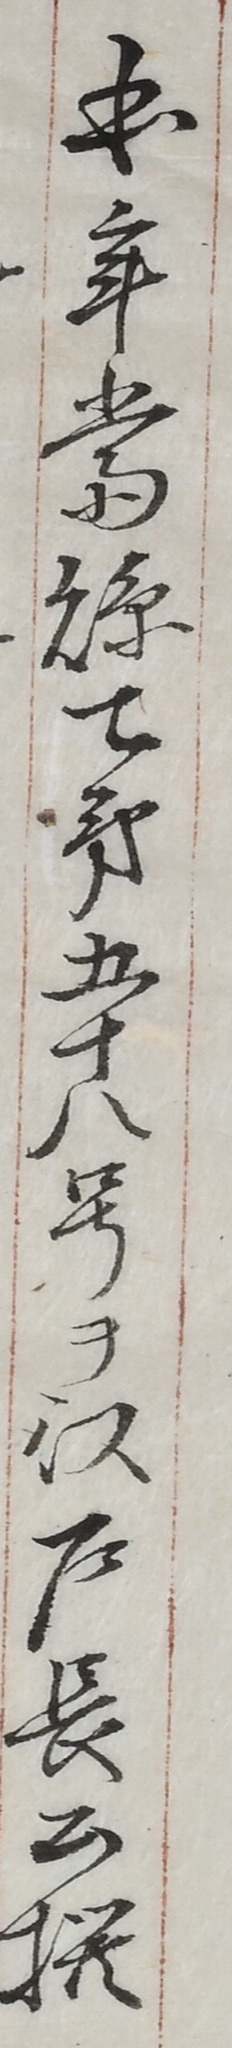本年当県乙第五十八号ヲ以戸長公撰
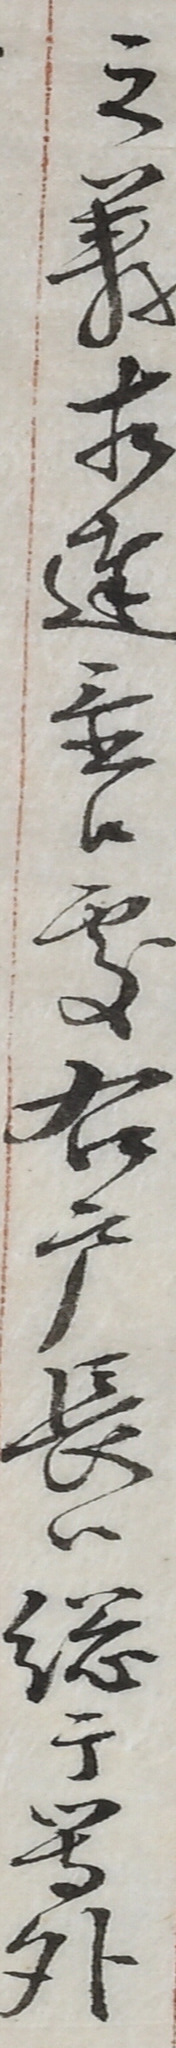之義相達置候処右戸長ハ総テ等外
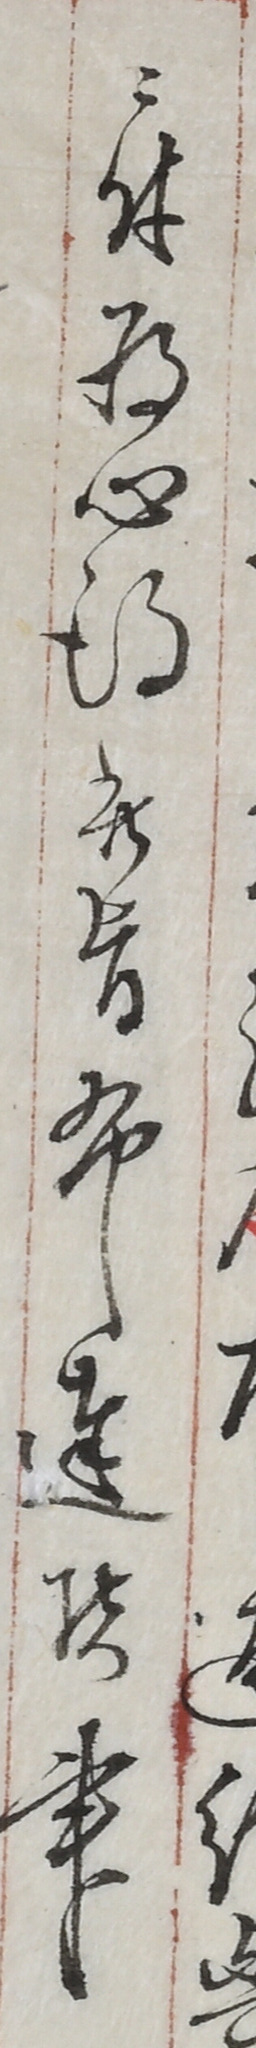ニ付為心得此旨布達候事
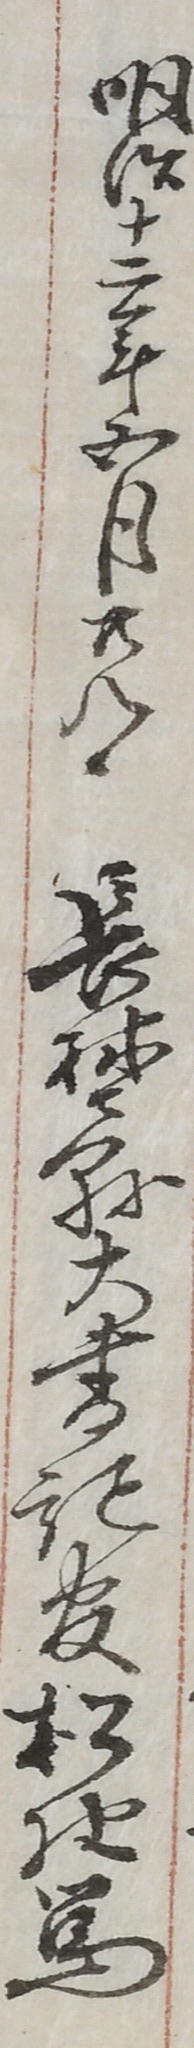明治十二年五月廿八日長野縣大書記官松野篤
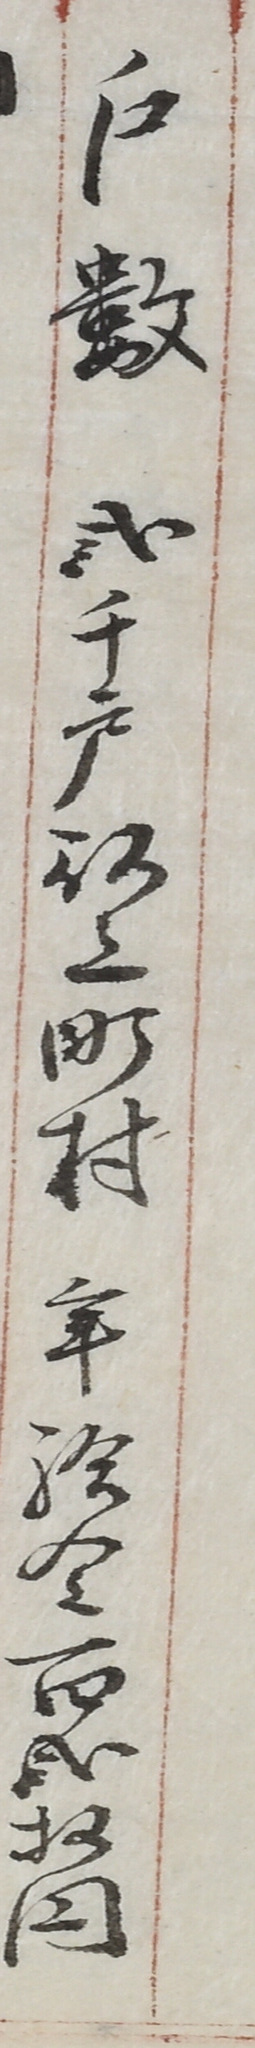戸数弐千戸以上町村年給金百弐拾円
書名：郡役所勤務中御用抜書
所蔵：伊那市立高遠町図書館・合同会社AMANE
